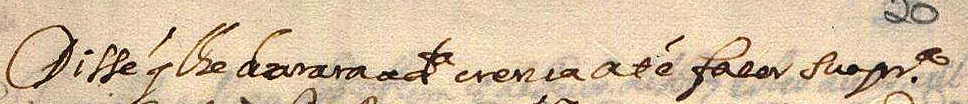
Disse q̄ lhe durara a d̄a crença até fazer sua pr.a
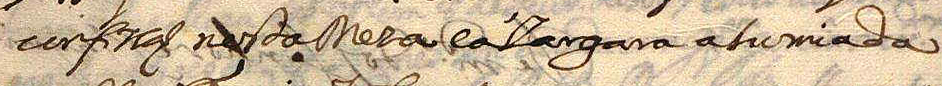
confissaõ nesta Meza e a largara alumiada
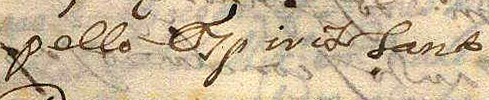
pello Espirito Santo
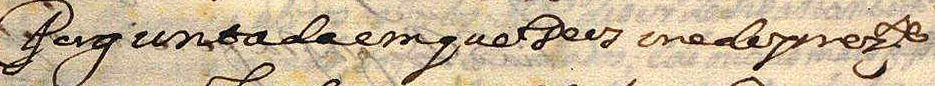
Perguntada em que Deos cre de prez.te
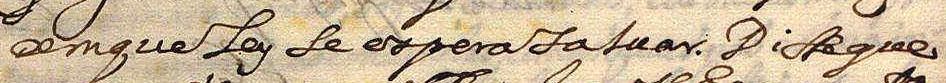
e em que Ley se espera saluar. Disse que
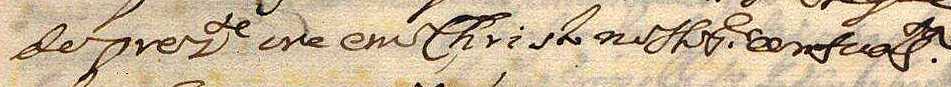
de prezte cre em Christo nosso s.or e em sua s.ta
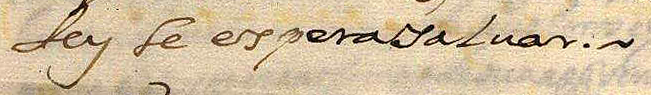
Ley se espera saluar.
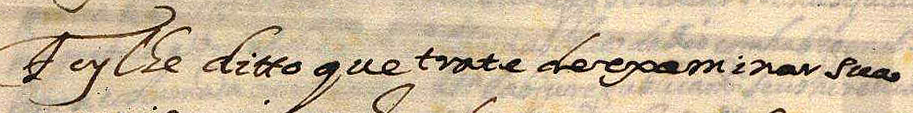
Foylhe ditto que trate de examinar sua
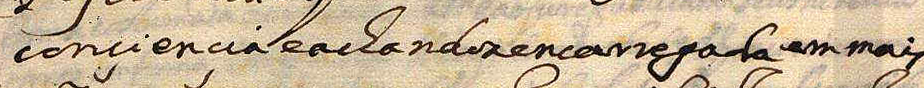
conciencia e achandoa encarregada em mais
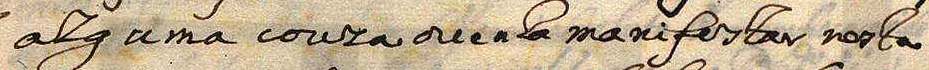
alguma couza o uenha manifestar nesta
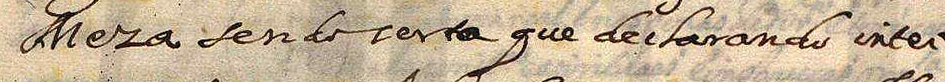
Meza sendo certa que declarando intei
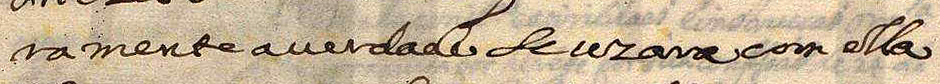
ramente a uerdade se uzara com ella
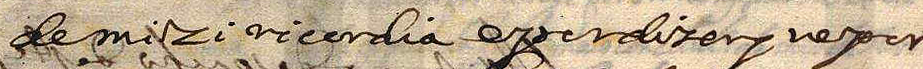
de miziricordia e por dizer que por
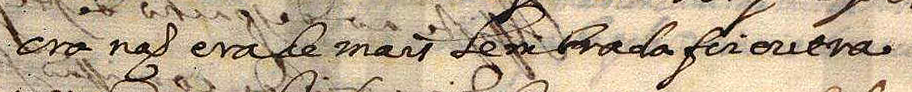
ora naõ era de mais Lembrada foi outra
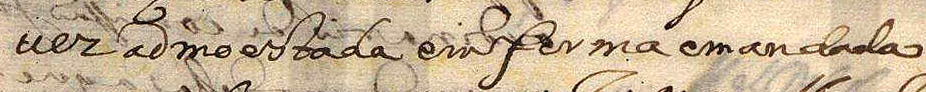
uez admoestada em forma e mandada
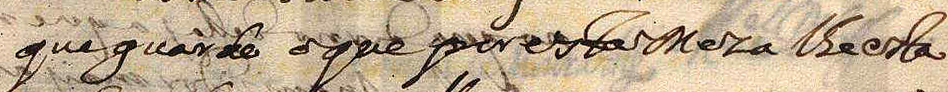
que guarde o que por esta Meza lhe esta
